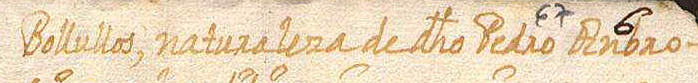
Bollullos, naturaleza de d̄ho Pedro Anbro
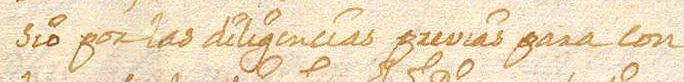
sio por las diligencias previas para con
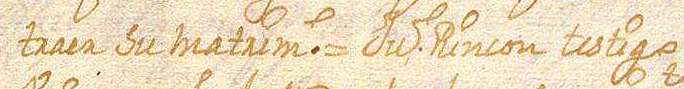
traer Su matrim.o = Ju.o Rincon testigo
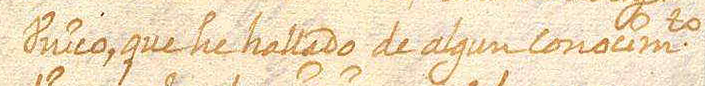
Vnico, que he hallado de algun conocim.to
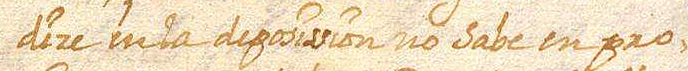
dize en la deposission no Sabe en pro,
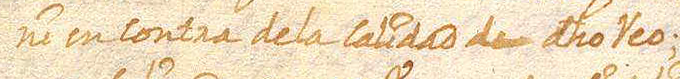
ni en contra de la calidad de d̄ho Reo;
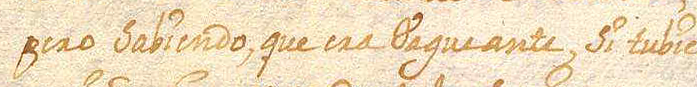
pero Sabiendo, que era Vagueante, si tubie
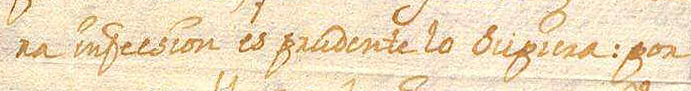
ra infecsion es prudente lo Supiera: por
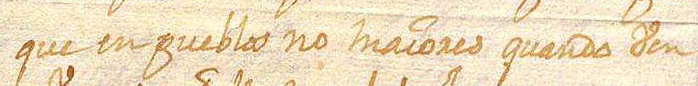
que en pueblos no maiores quando Ven
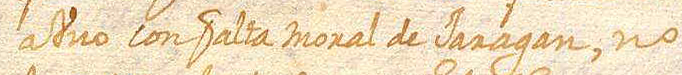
a Vno con falta moral de Iaragan, no
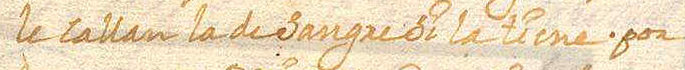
le callan la de Sangre Si la tiene. por
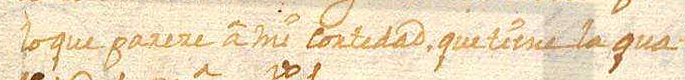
lo que pareze â mi cortedad, que tiene la qua
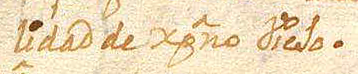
lidad de Xpn̄o Viejo.
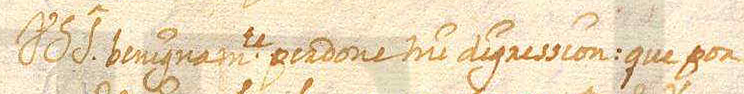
VSI. benignam.te perdone mi degression: que por
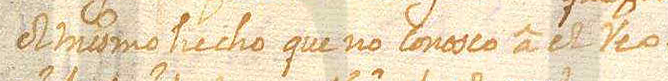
el mismo hecho que no conosco â el Reo,
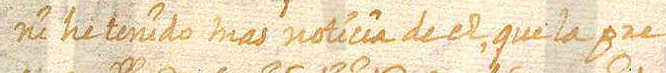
ni he tenido mas noticia de el, que la pre
